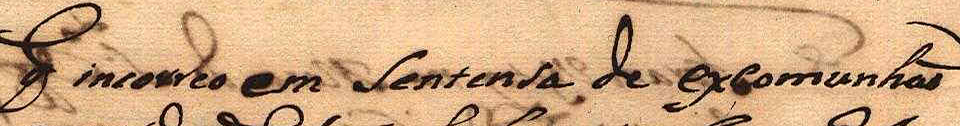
q̄ incorreo em sentensa de excomunhaõ
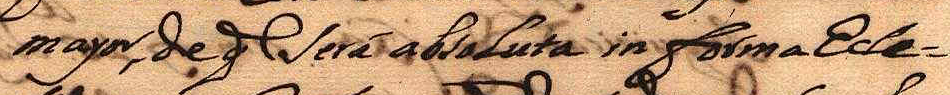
mayor, de q̄ será absoluta in forma Ecle
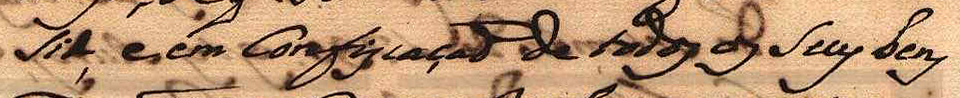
si_, e em Confiscaçaõ de todos os seus bens
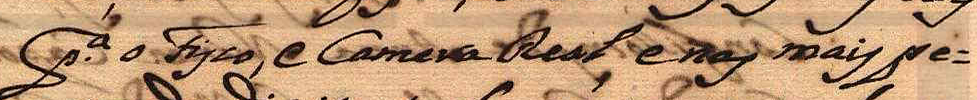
p̄.a o Fisco, e Camera Real, e nas mais pe
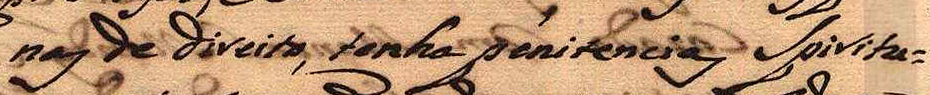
nas de direito, tenha penitencias Spiritu
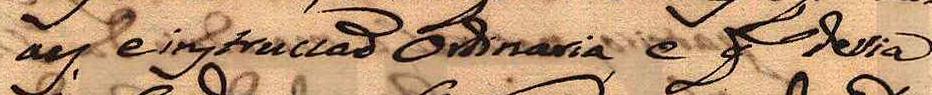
aes, e instrucão ordinaria, e q̄ devia
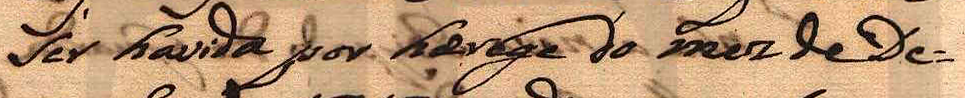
ser havida por herege do mez de De
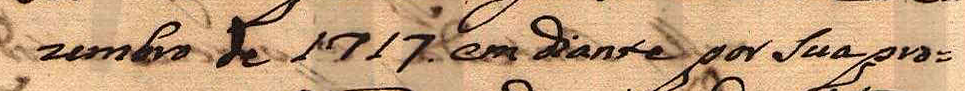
zembro de 1717. em diante por sua pro
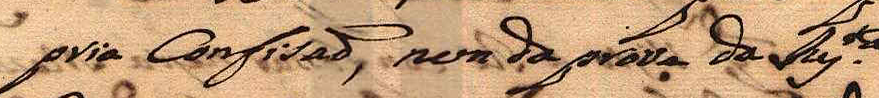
pria Confisaõ, nem da prova da Ius.ta
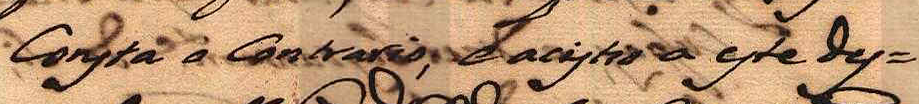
Consta o contrario, E acistio a este des
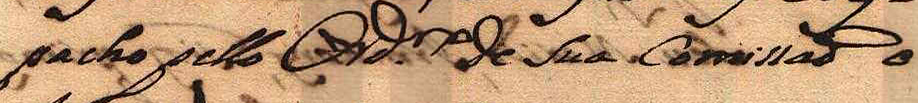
pacho pello Ord.ro de sua Comissaõ o
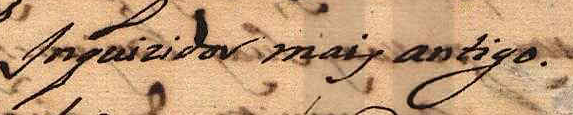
Inquizidor mais antigo.
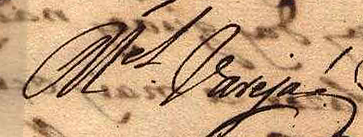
M.el Varejaõ
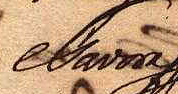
e Tavora
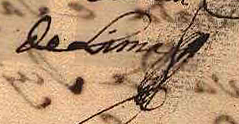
de Lima Sylv. Lobo
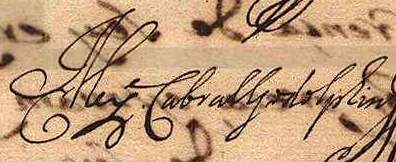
Alexe Cabral Godolphin
